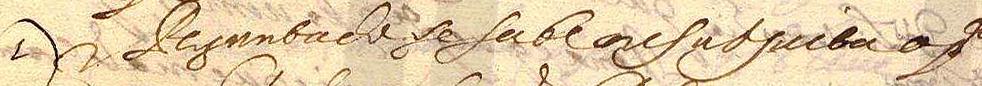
Perguntado se sabe ou suspeita o pa
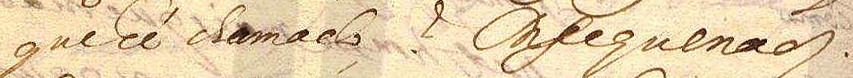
que hé chamado? Disse que naõ
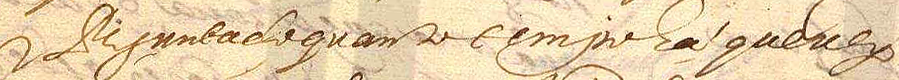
Perguntado quanto tempo há que ueyo
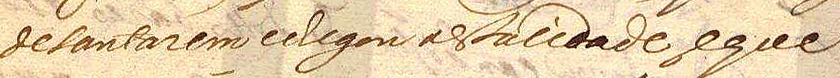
de santarem, e chegou a esta cidade e que
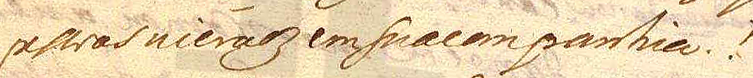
pessoas uieraõ em sua companhia?
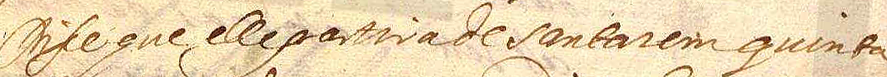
Disse que elle partira de santarem quinta
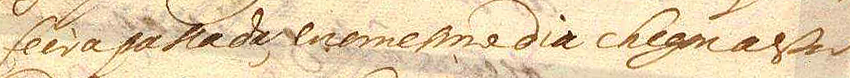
feira passada, e no mesmo dia chegou a esta
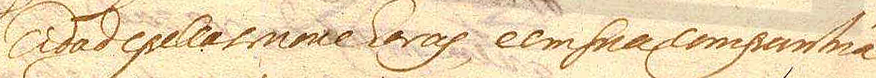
cidade pellas noue horas, e em sua companhia
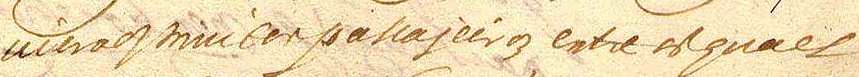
uieraõ muitos passajeiros entre os quaes
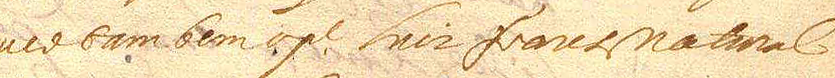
ueo tambem o pe Luiz soares natural
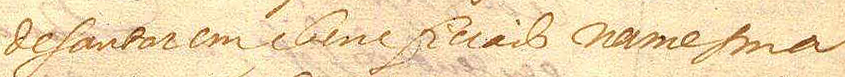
de santarem, e beneficiado na mesma
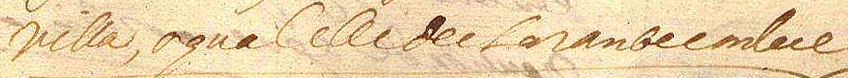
villa, o qual elle declarante conhece
